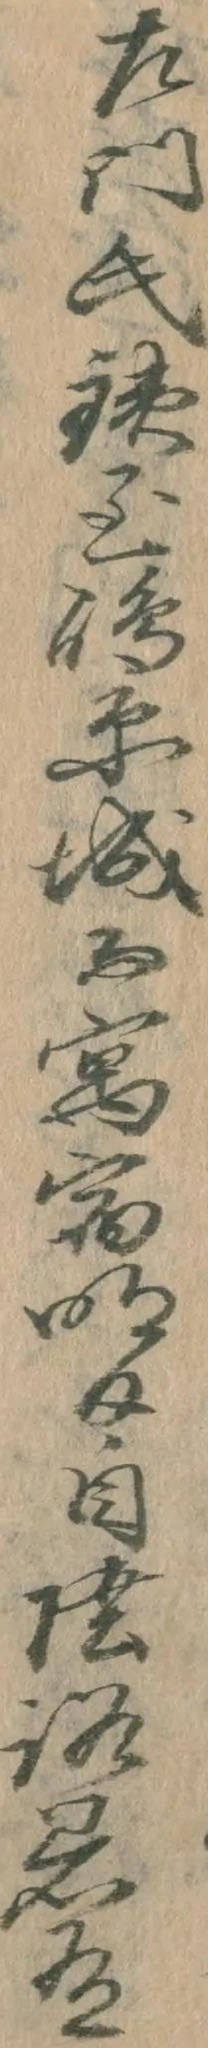左門氏鉄至島原城而寓宿明日自陸路着有
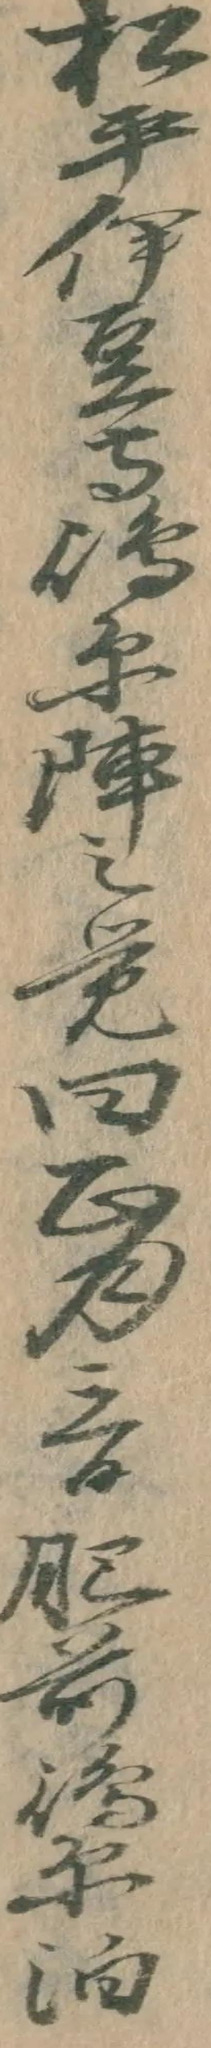松平伊豆守島原陣之覚曰正月三日肥前島原泊
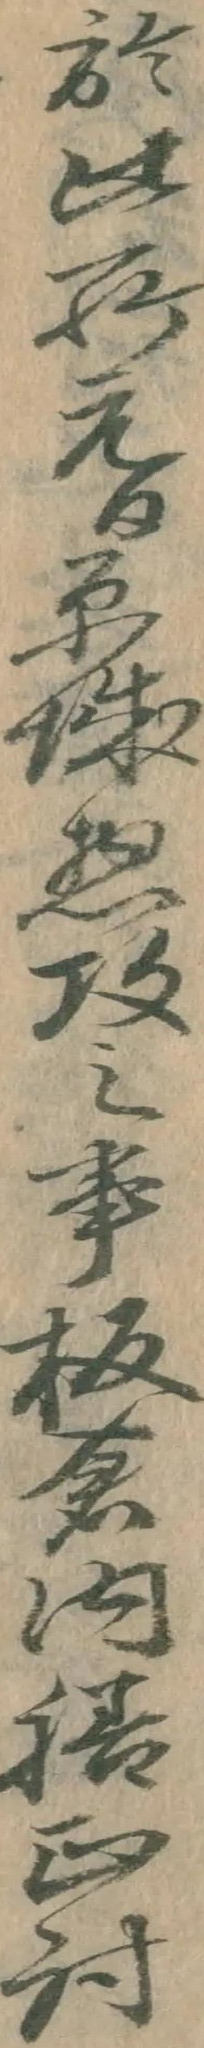於此所元日原城惣攻之事板倉内膳正討
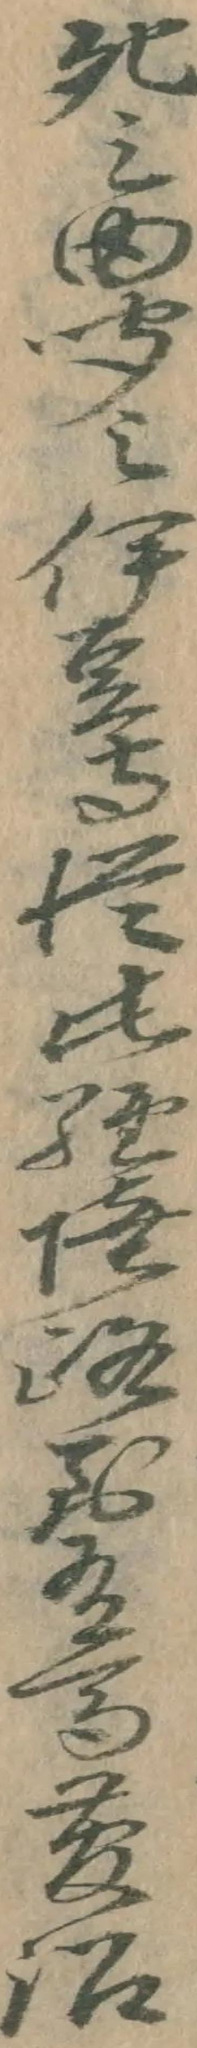死之由聞之伊豆守従此騒陸路至有馬藤沼

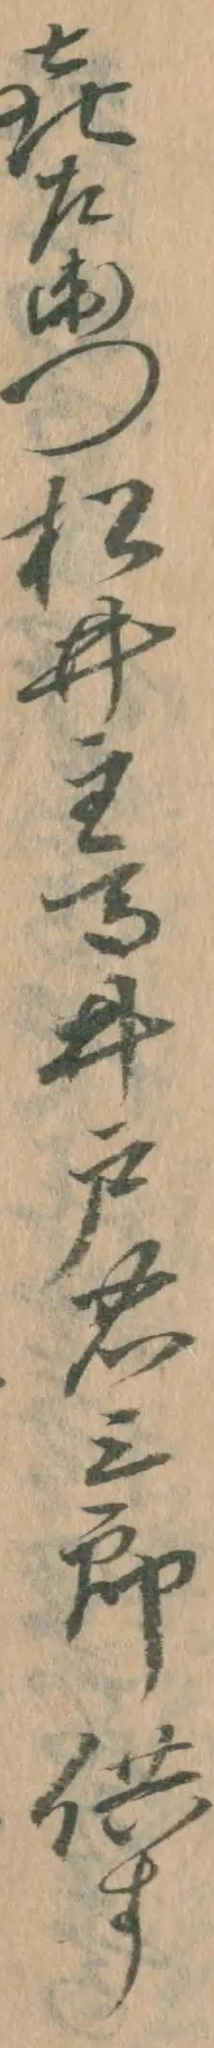喜左衛門松井主馬井戸忠三郎供す
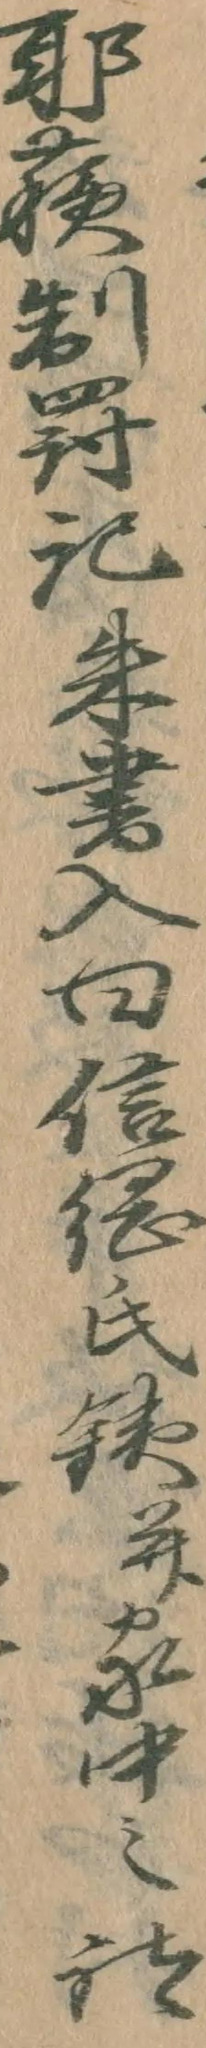耶蘇制罸記朱書入曰信綱氏銕幷家中之諸
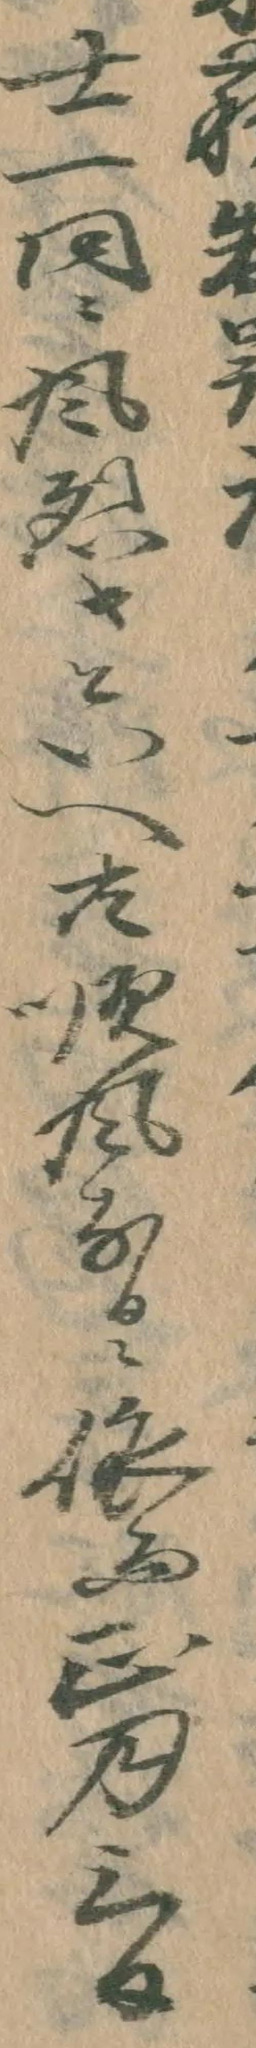士一同に風烈きといへ共順風なるに依而正月三日
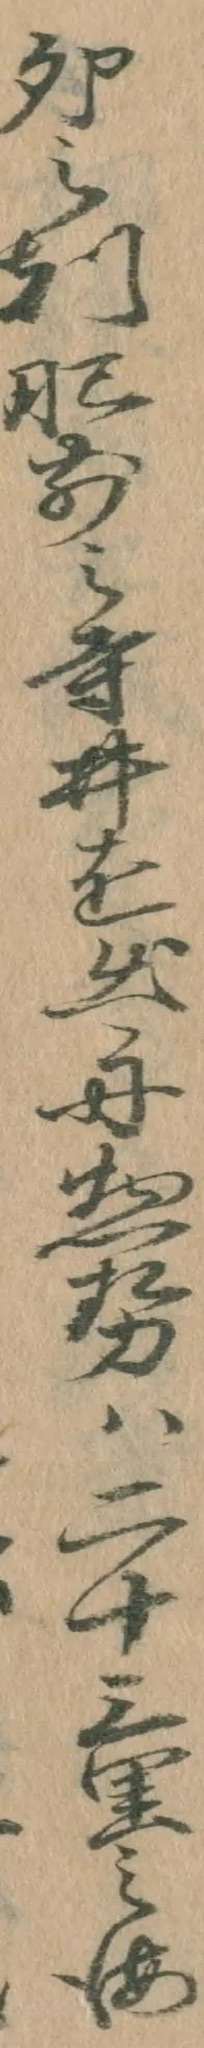夘之刻肥前之寺井を出舟惣勢は二十三里之海
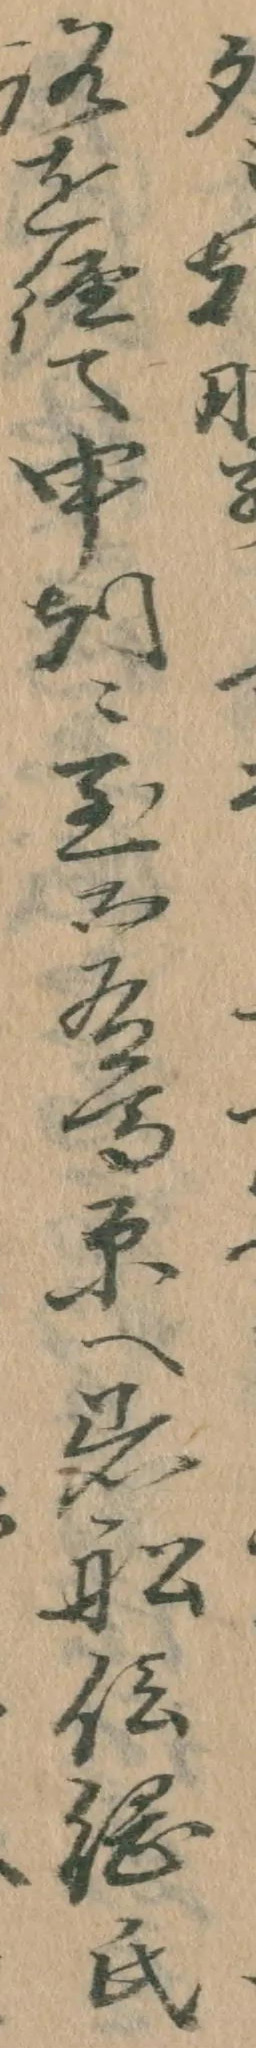路を経て申刻に至而有馬原へ着舩信綱氏
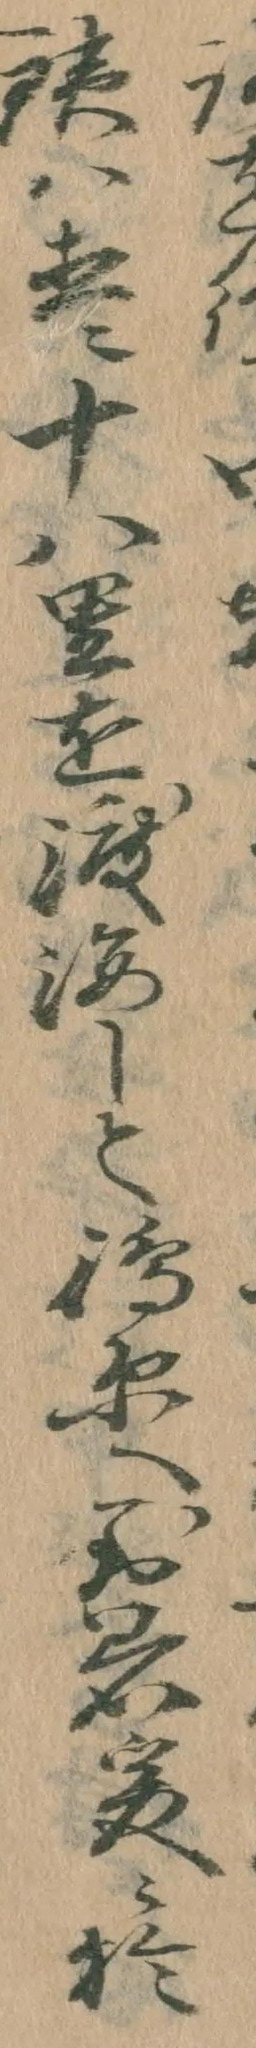銕は直に十八里を渡海して島原へ至着爰に於
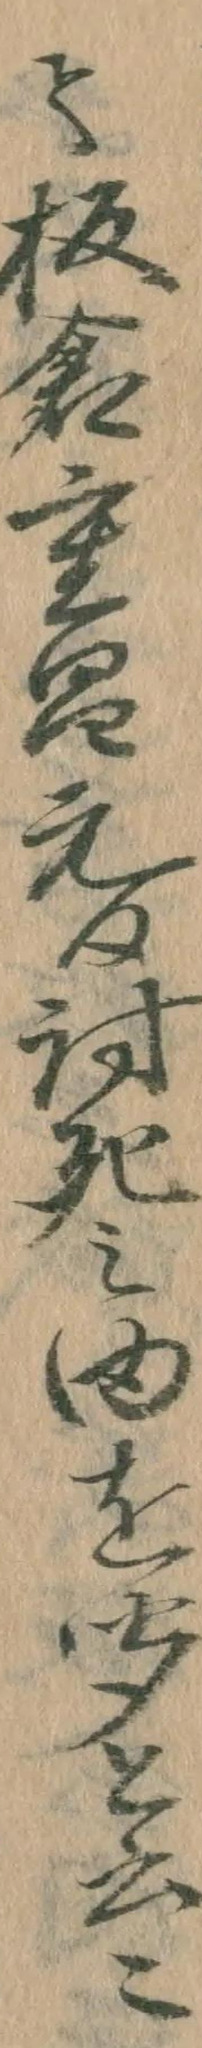て板倉重昌元日討死之由を聞と云々
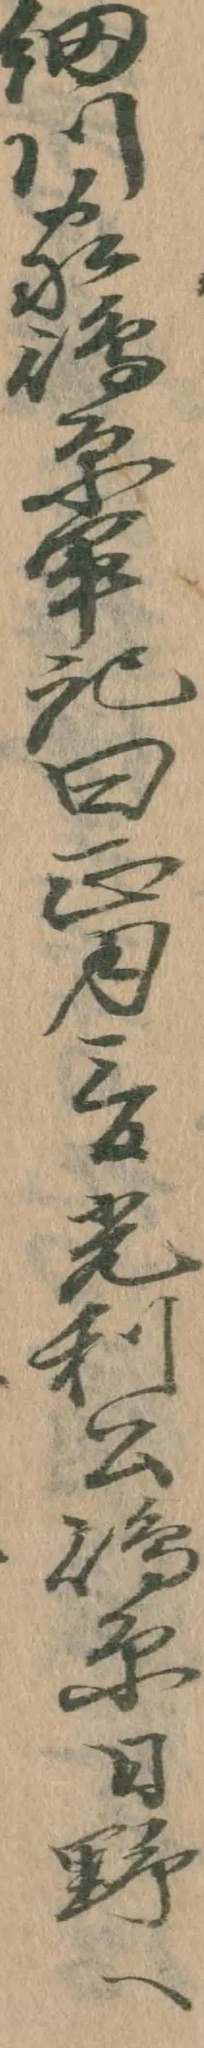細川家島原軍記曰正月三日光利公島原日野へ
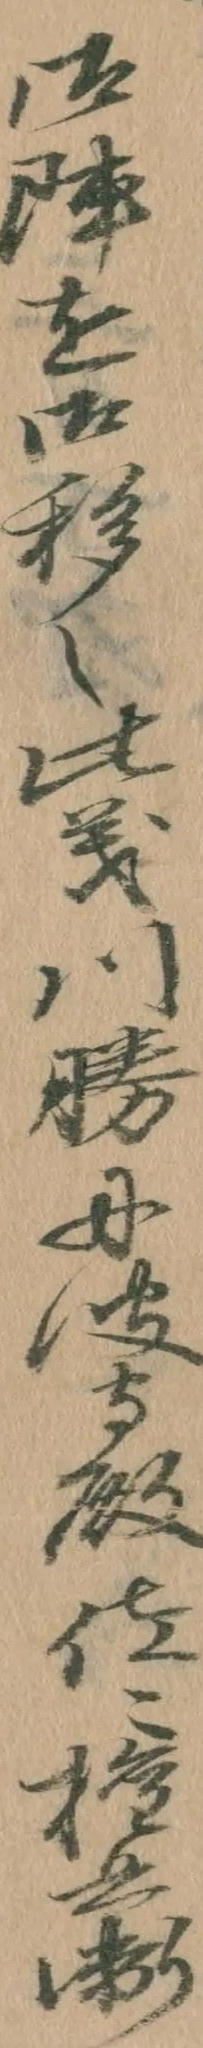御陣を御移し此義川勝丹波守殿佐々権兵衛
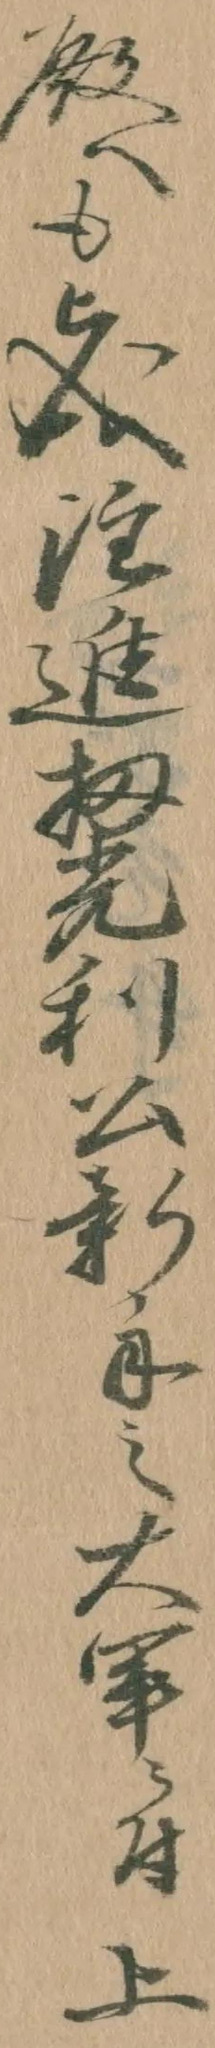殿へも被成注進扨光利公新手之大軍に付上
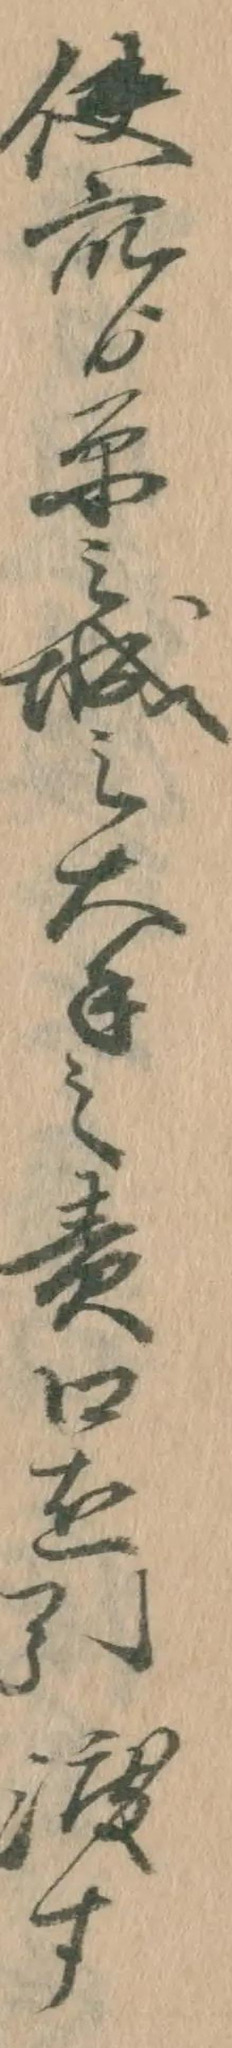使衆ゟ原之城之大手之責口を引渡す
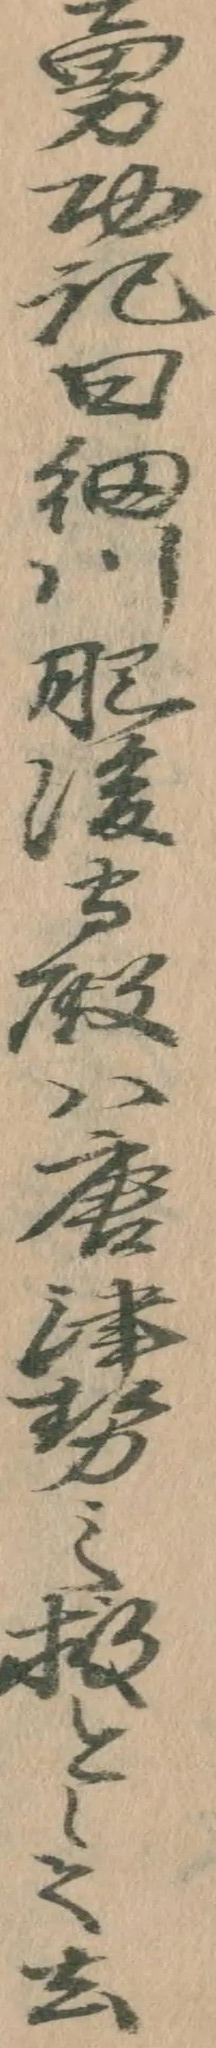勇功記曰細川肥後守殿は唐津勢之救として去
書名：切支丹御退治記 49巻. [5]
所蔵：国立国会図書館 National Diet Library, JAPAN
